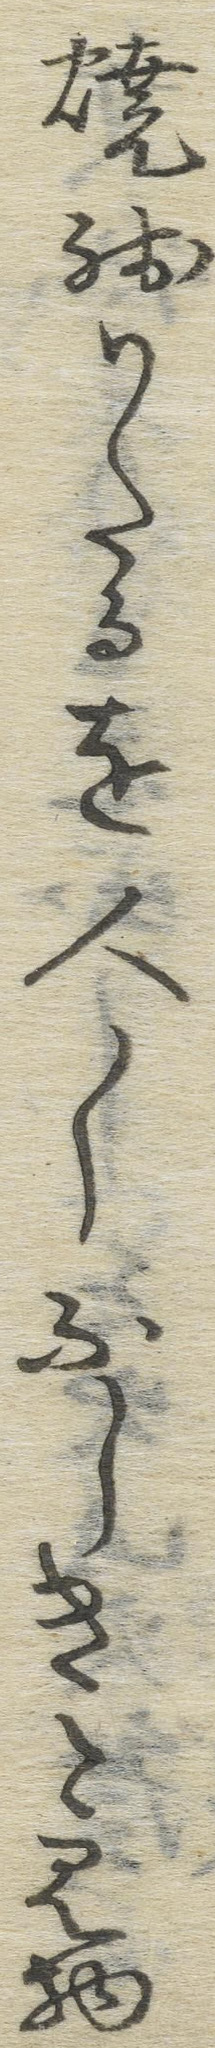焼け残りたるを人〳〵ふしきと見物
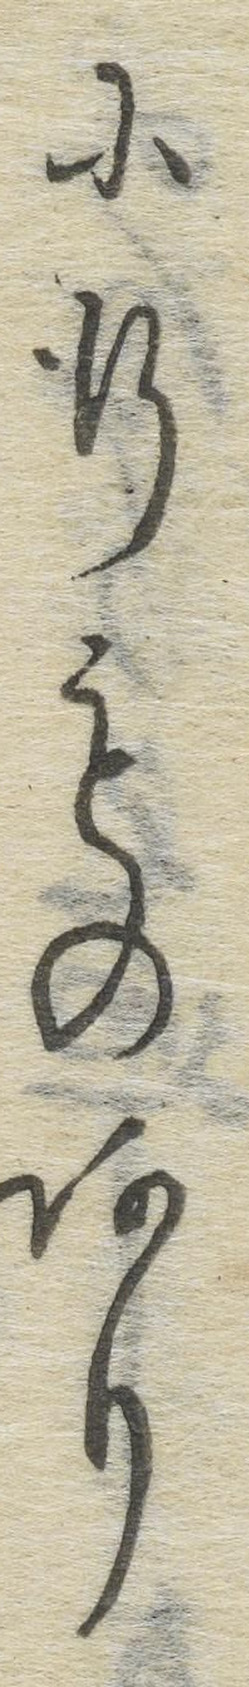に行ものあり
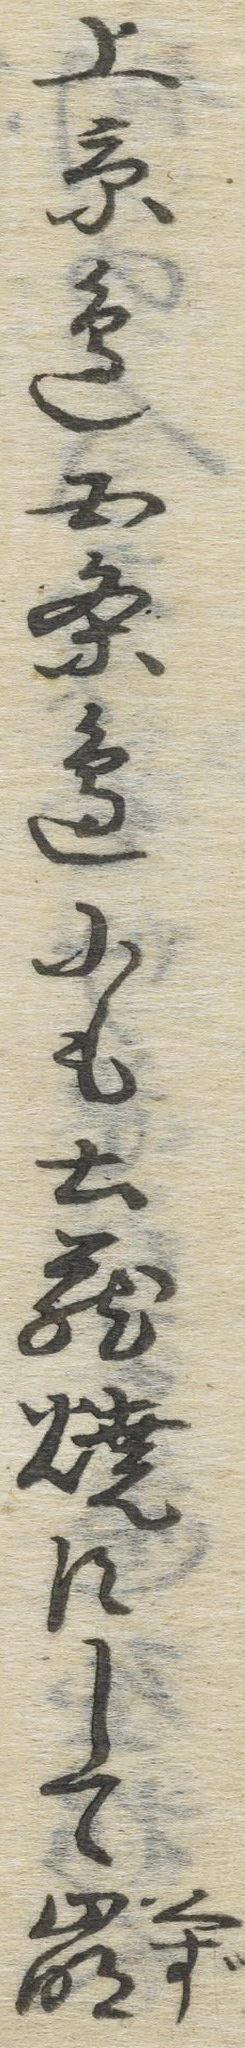上京辺五条辺にも土蔵焼すして崩
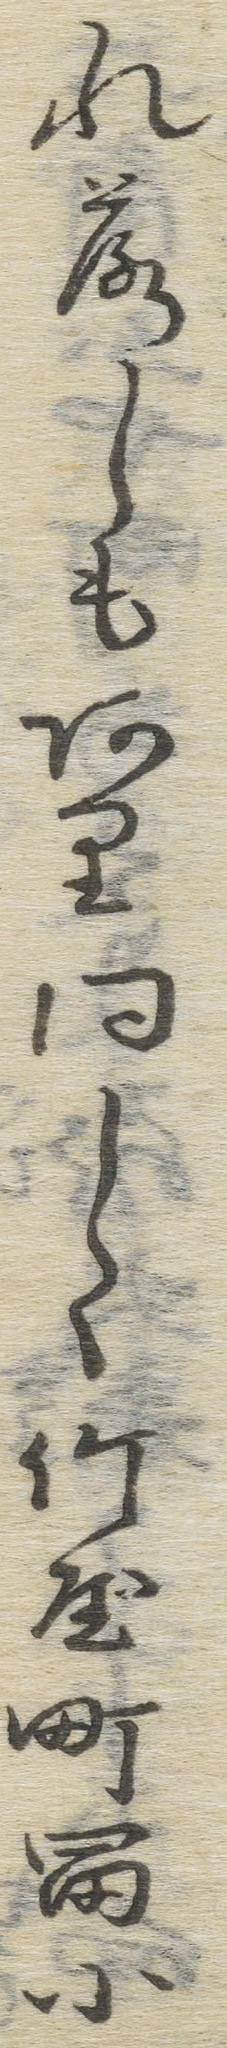れ落しもあり同しく竹屋町冨小
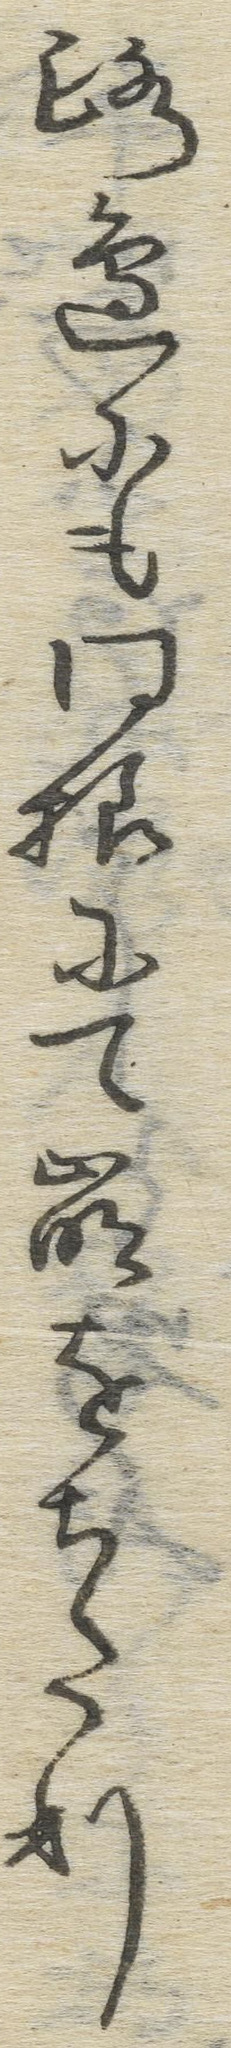路辺にも同様にて崩をちたり
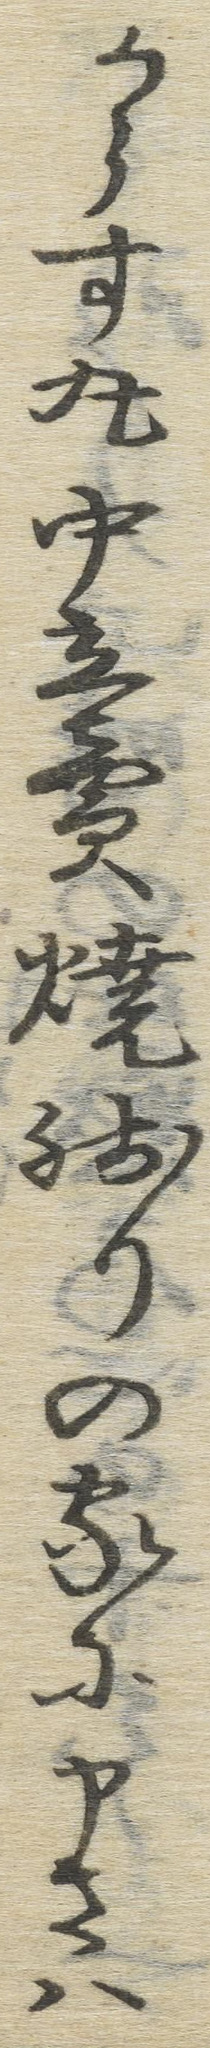からす丸中立売焼残りの家に申さは
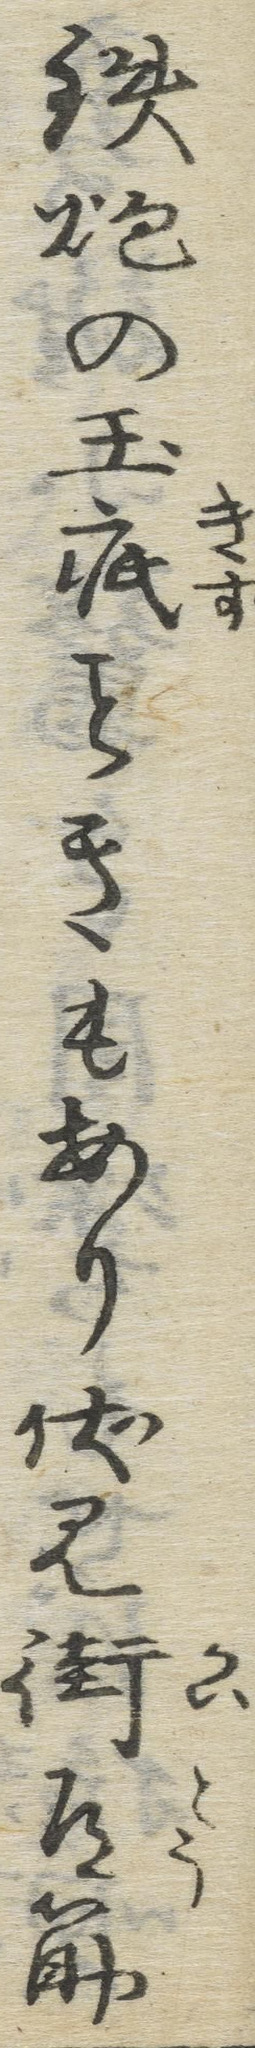鉄砲の玉疵をきもあり伏見街道筋
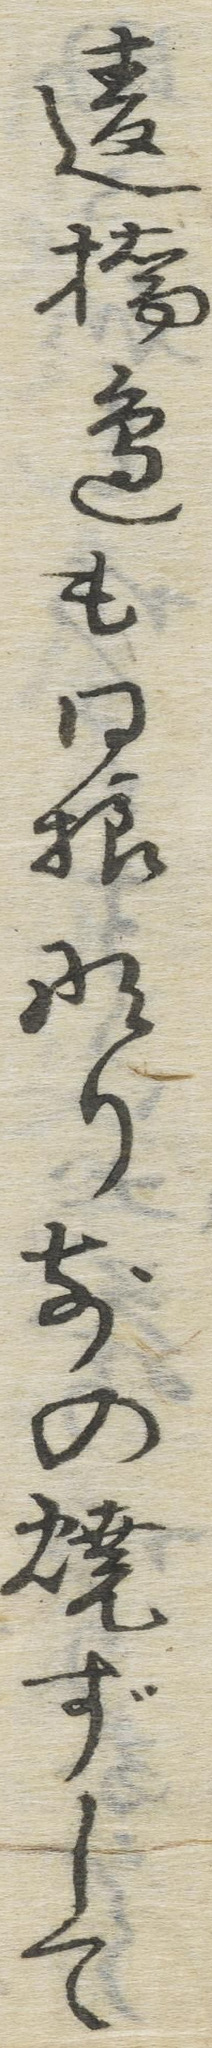違橋辺も同様なり前の焼ずして
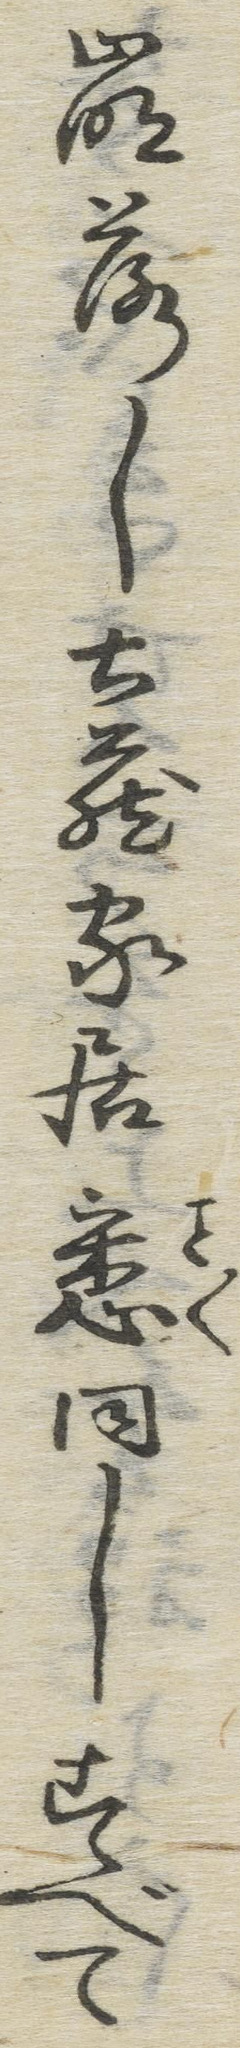崩落し古蔵家居悉同しすべて
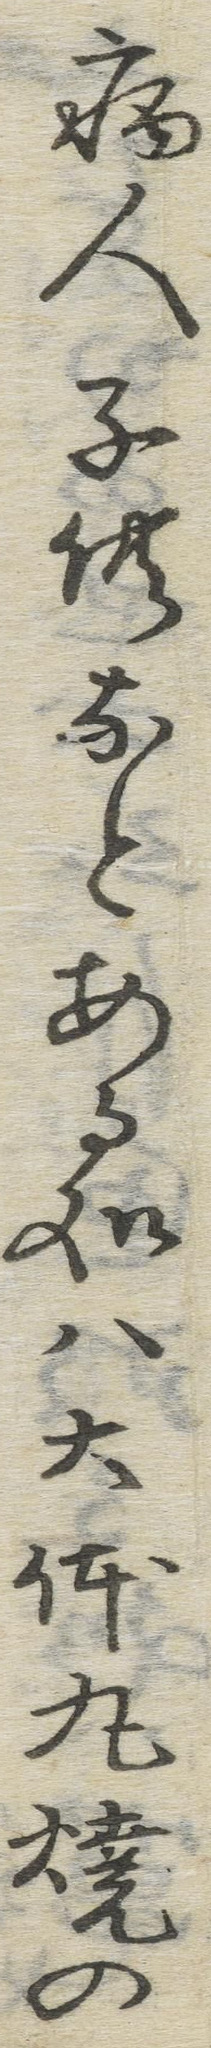病人子供なとある処は大体丸焼の
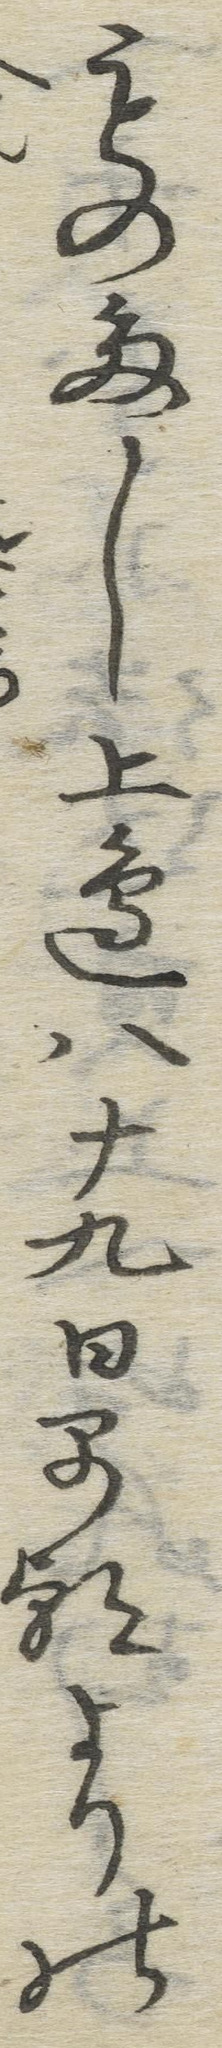もの多し上邊は十九日よるよりの
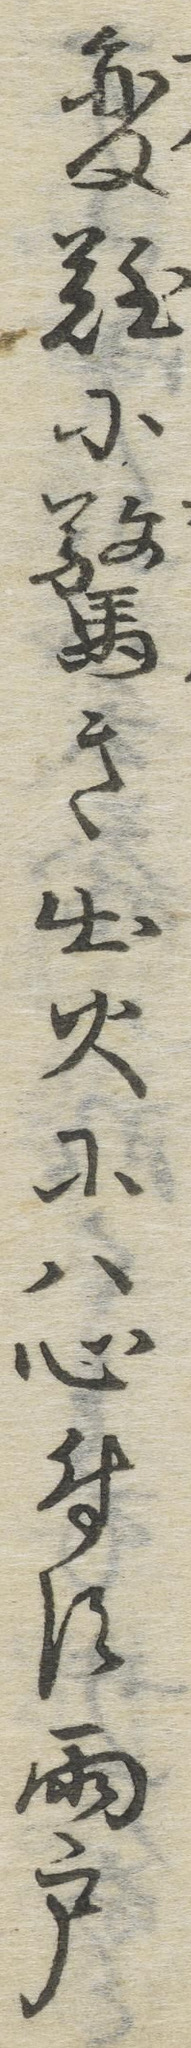変難に驚き出火には心付す雨戸
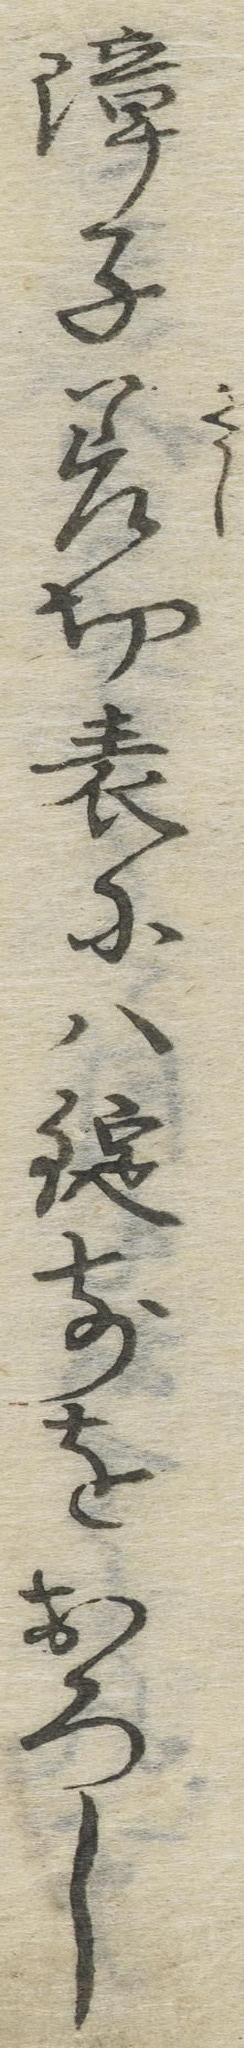障子差切表には錠前をおろし
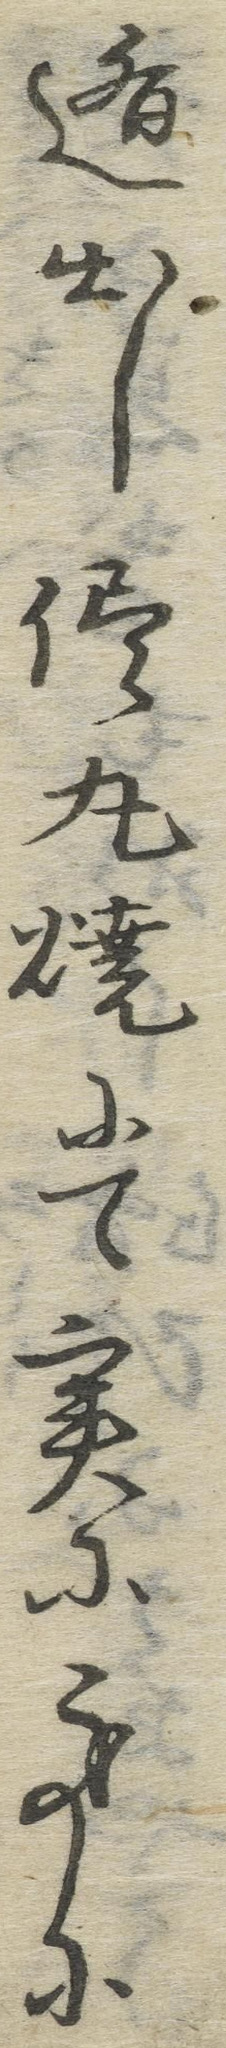遁出し候丸焼にて実に身に

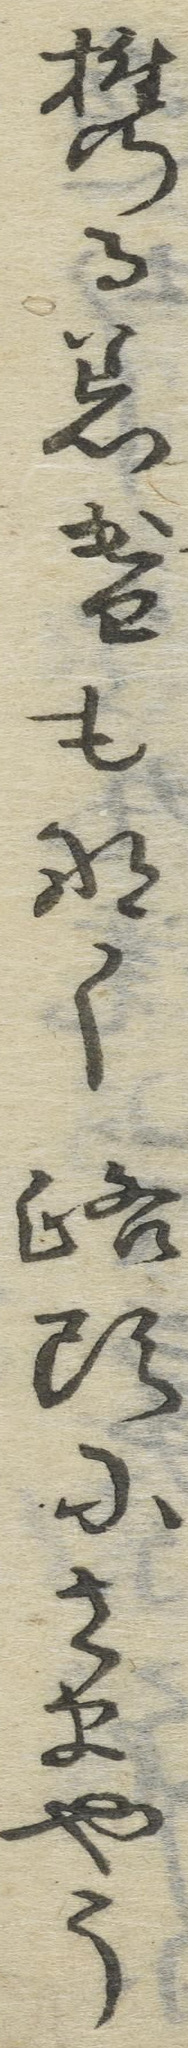携る着替もなく路頭にさまやう
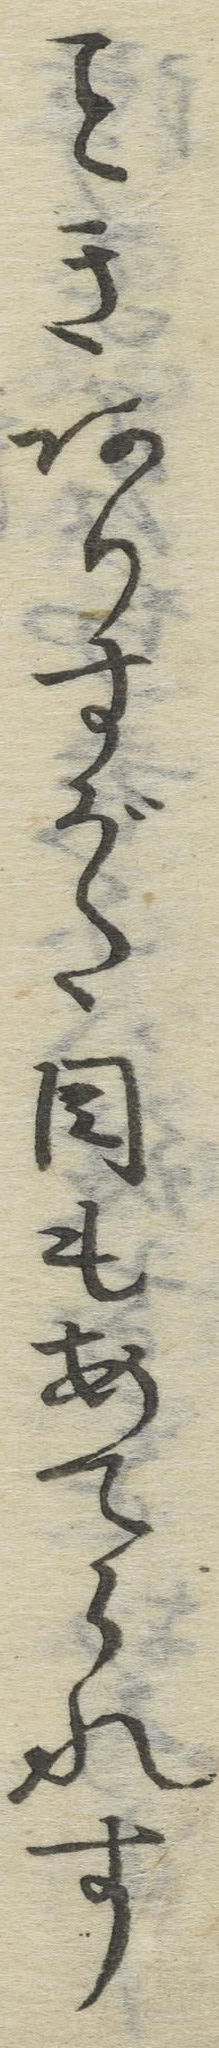こときありすがた目もあてられす
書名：あきの日照
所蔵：東京大学地震研究所図書室 Earthquake Research Institute Library, The University of Tokyo, JAPAN
